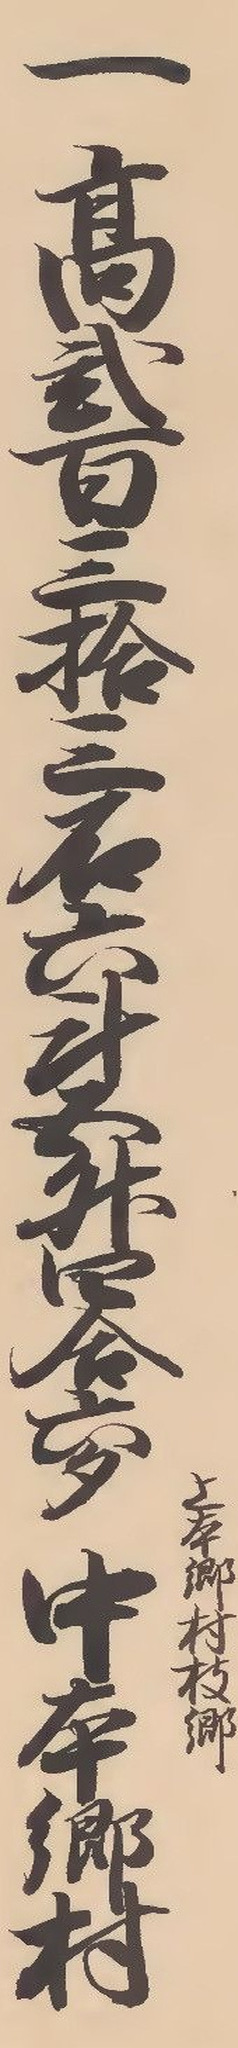一高弐百弐拾壱石九斗八升壱合六勺上本郷村
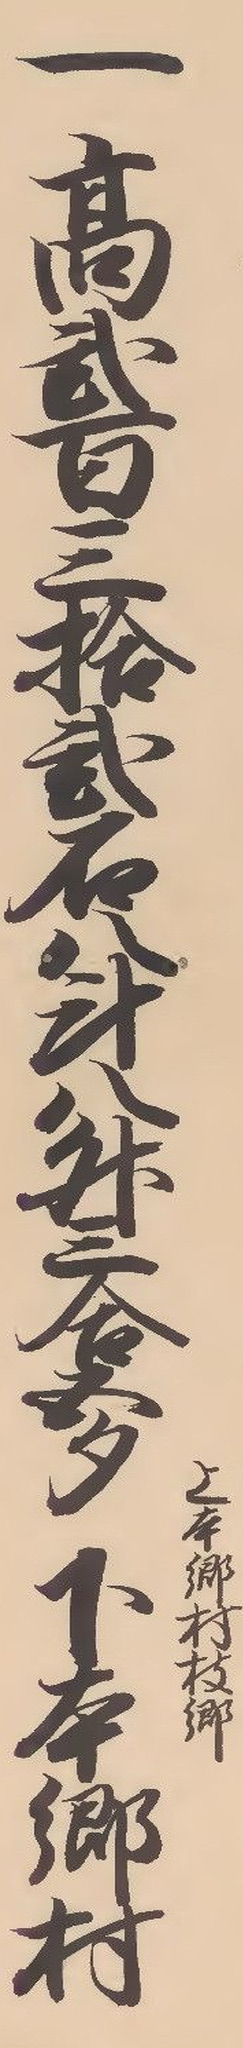一高弐百弐拾壱石九斗八升壱合六勺上本郷村

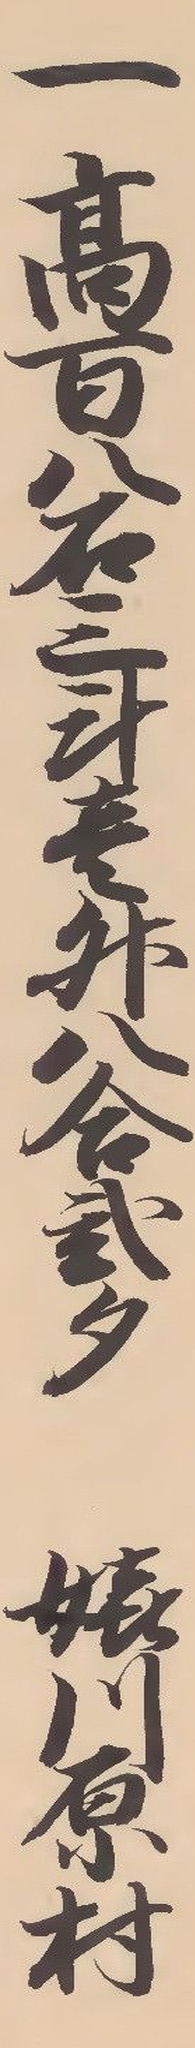一高百八石三斗壱升八合弐勺嬉川原村
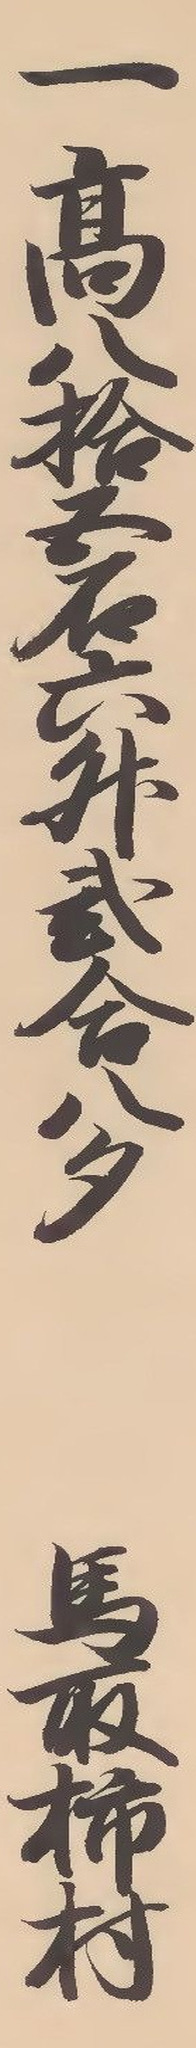一高八拾五石六升弐合八勺馬取柿村
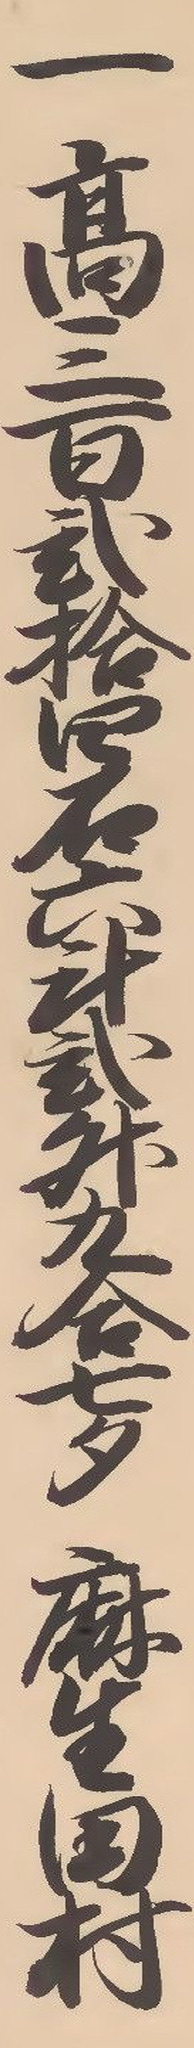一高三百弐拾四石六斗弐升九合七勺麻生田村
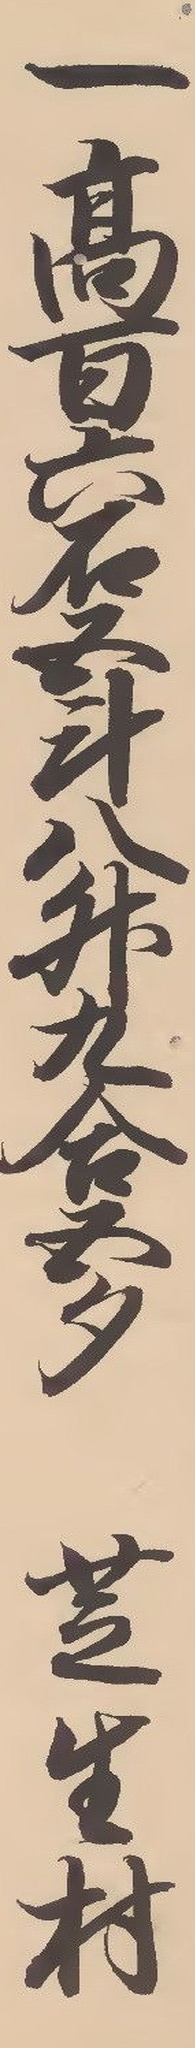一高百六石五斗八升九合五勺芝生村
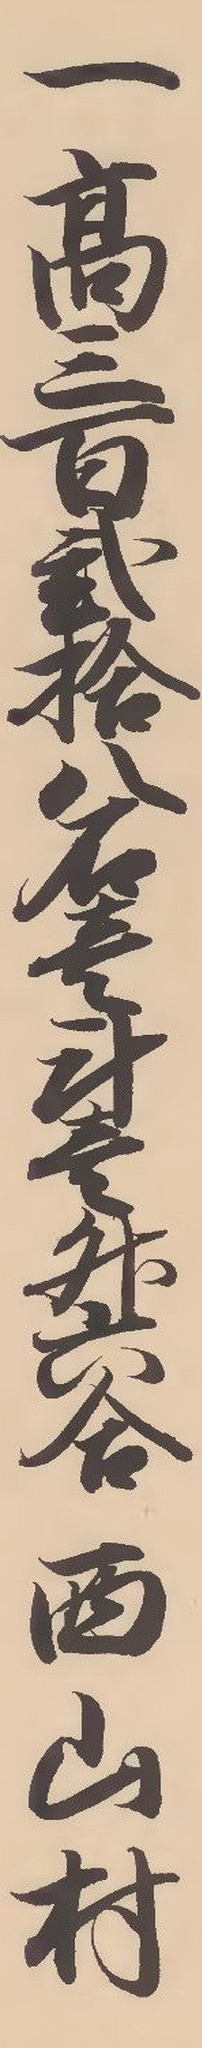一高三百弐拾八石壱斗壱升六合西山村
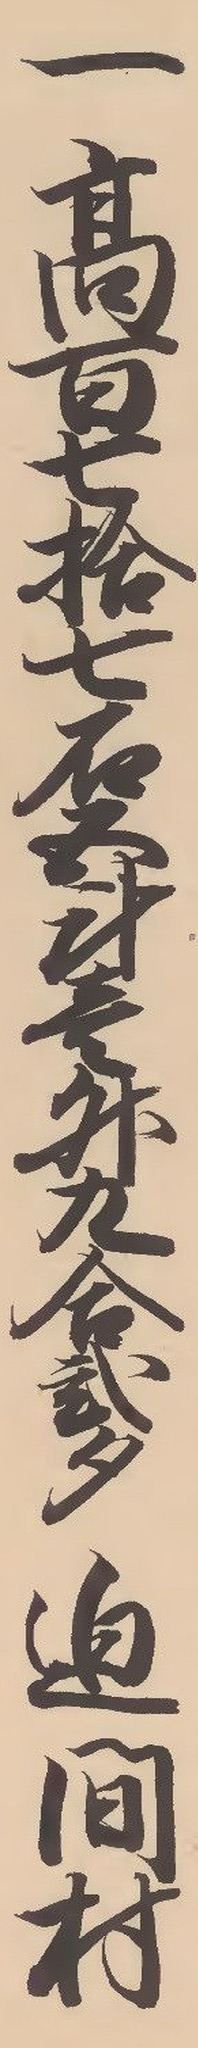一高百七拾七石五斗壱升九合弐勺迫間村
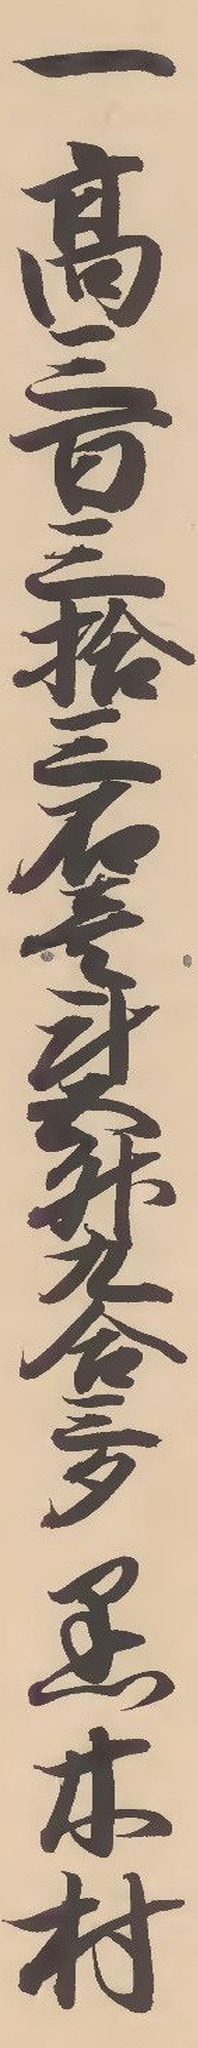一高三百三拾三石壱斗五升九合三勺黒木村

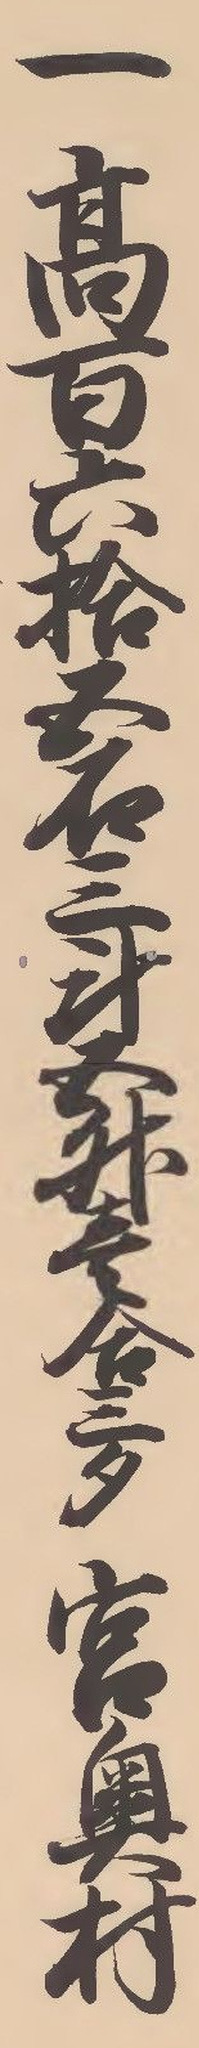一高百六拾五石三斗五升壱合三勺宮奥村
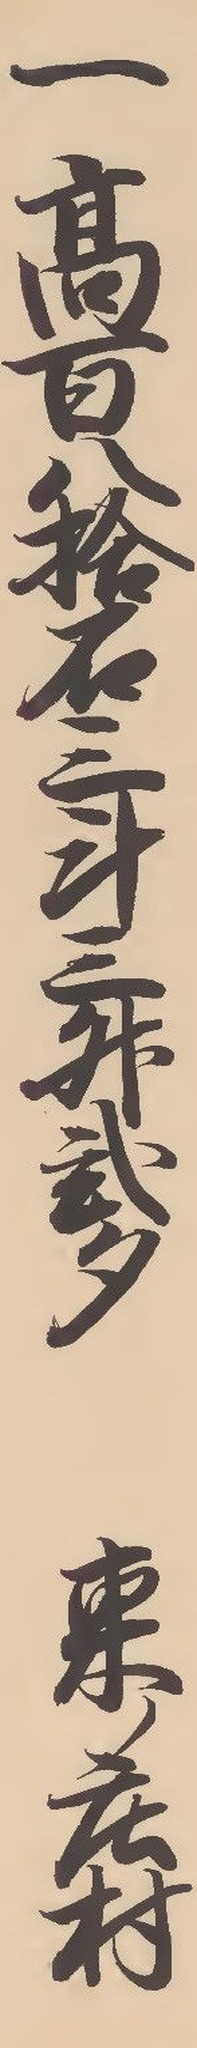一高百八拾石三斗三升弐勺東ノ庄村
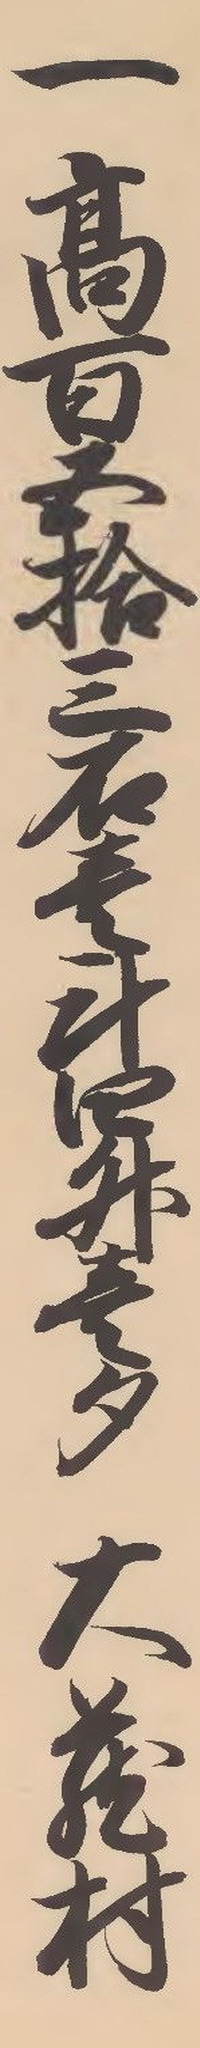一高百五拾三石壱斗四升壱勺大蔵村
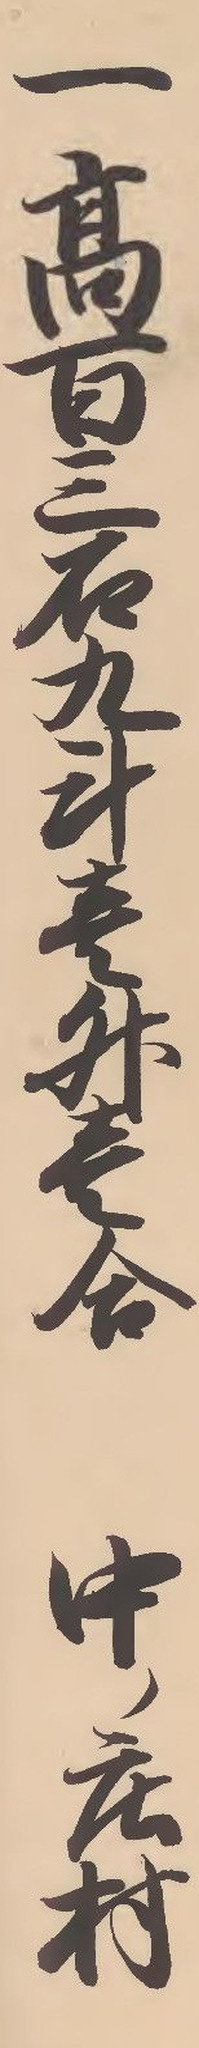一高百三石九斗壱升壱合中ノ庄村
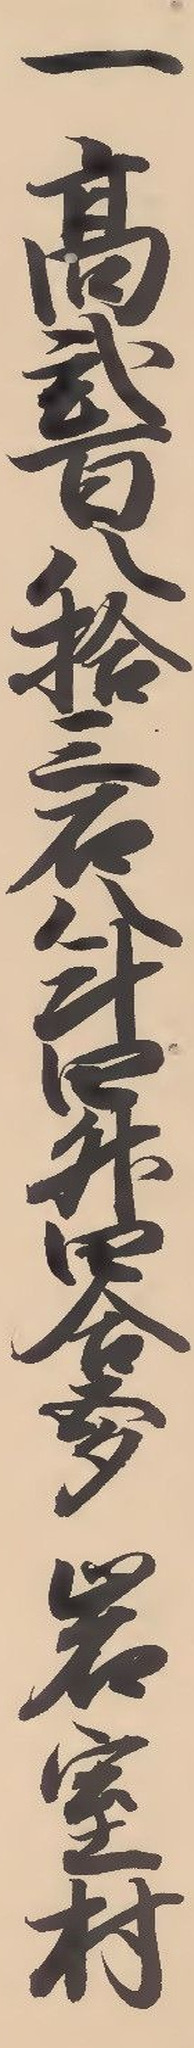一高弐百八拾三石八斗四升四合五勺岩室村
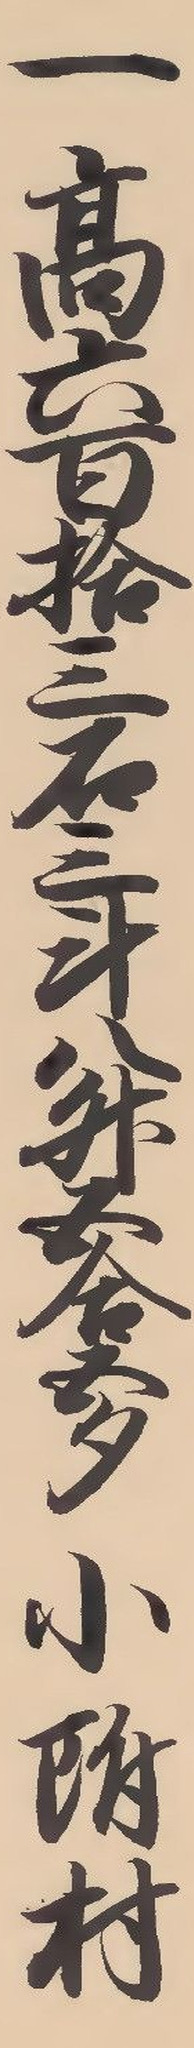一高六百拾三石三斗八升五合五勺小附村
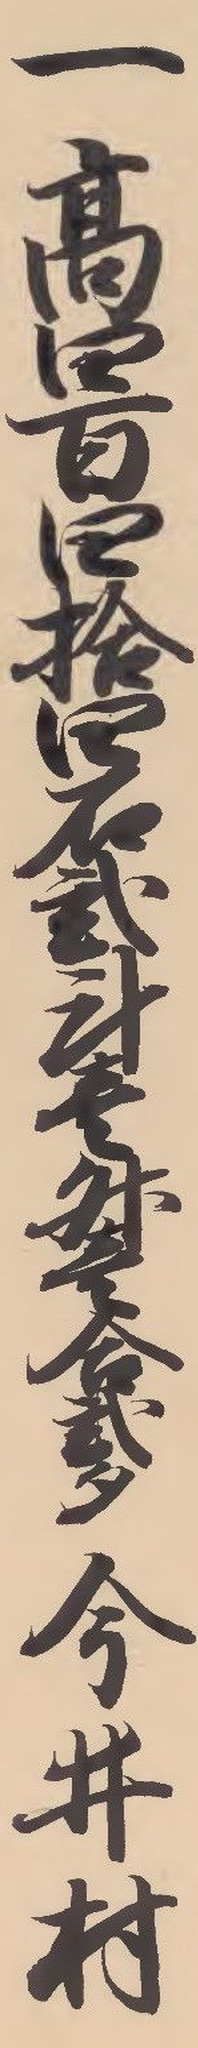一高四百四拾四石弐斗壱升壱合弐勺今井村
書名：大和国郷帳
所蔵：国立公文書館 National Archives of Japan
